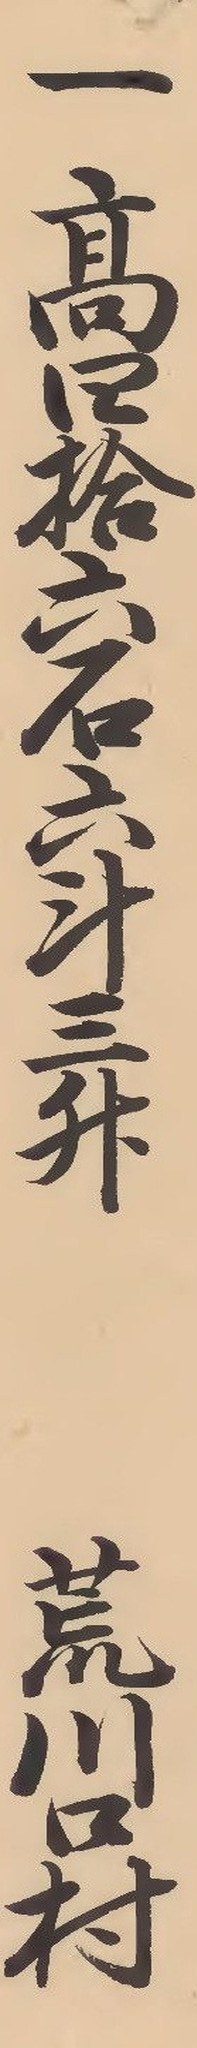一高四拾六石六斗三升荒川口村
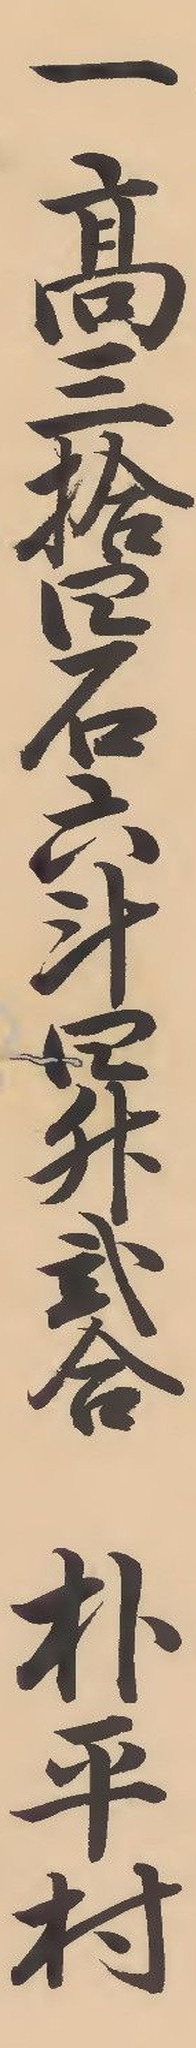一高三拾四石六斗四升弐合朴平村

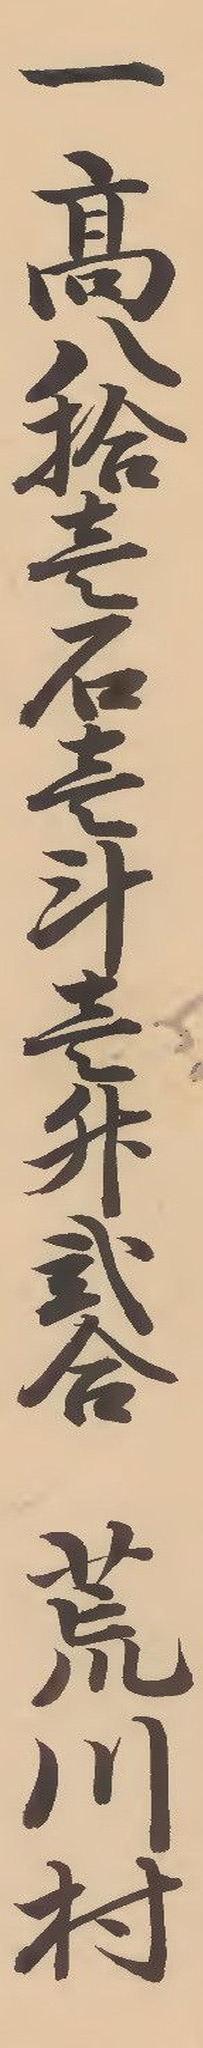一高八拾壱石壱斗壱升弐合荒川村
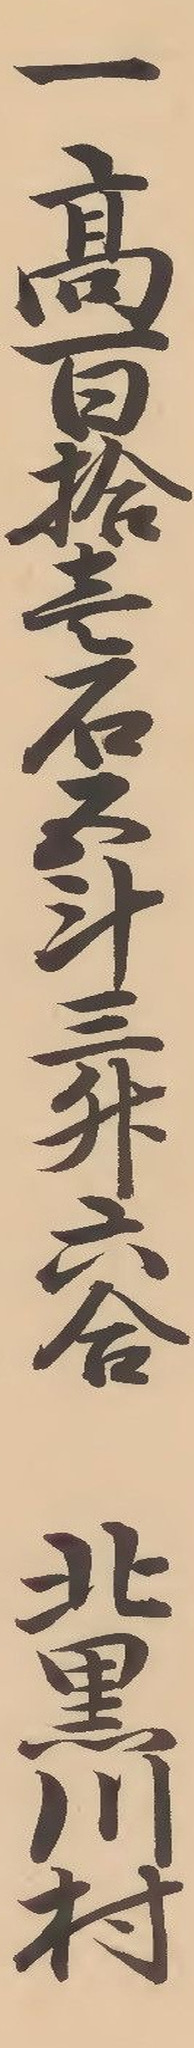一高百拾壱石五斗三升六合北黒川村
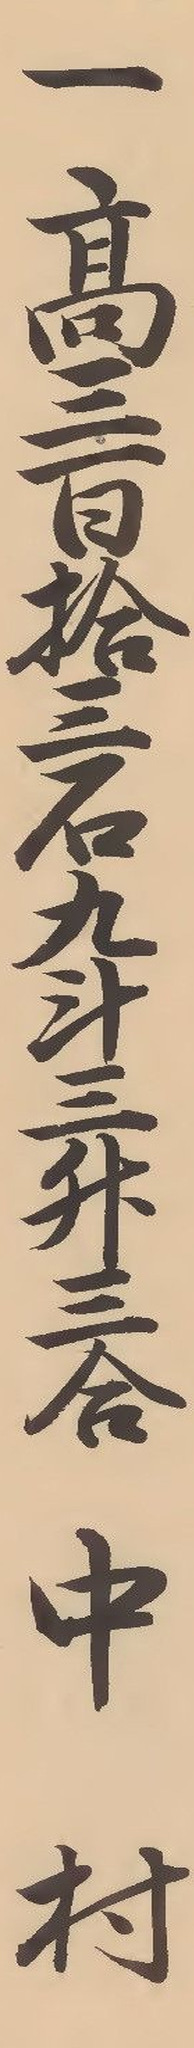一高三百拾三石九斗三升三合中村
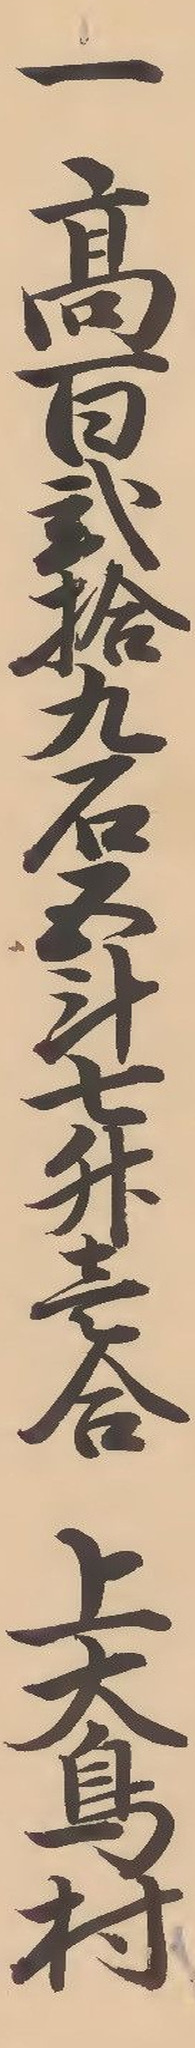一高百弐拾九石五斗七升壱合上大島村
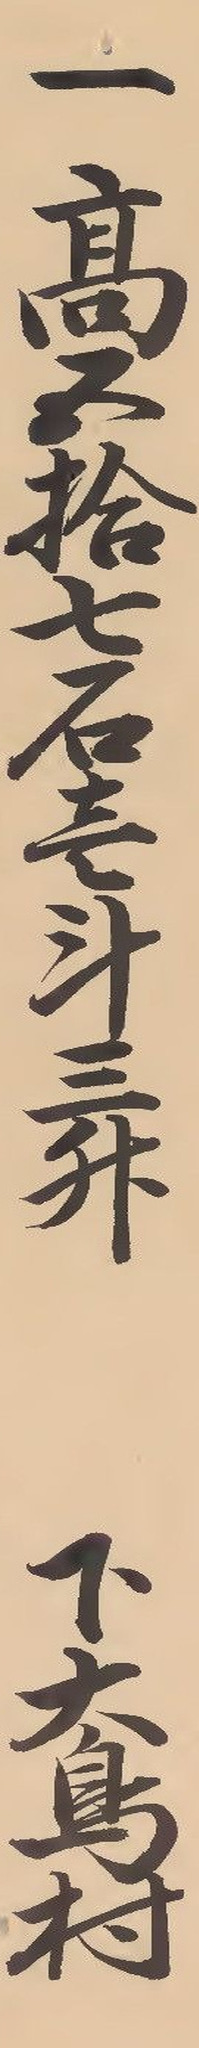一高五拾七石壱斗三升下大島村
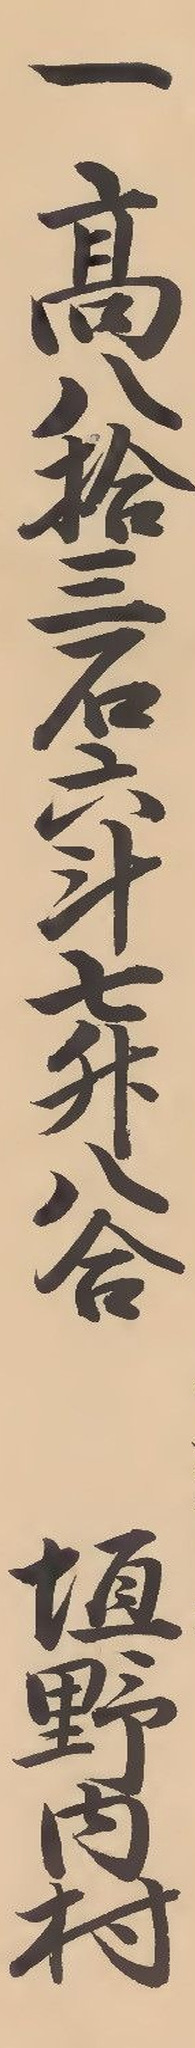一高八拾三石六斗七升八合垣野内村
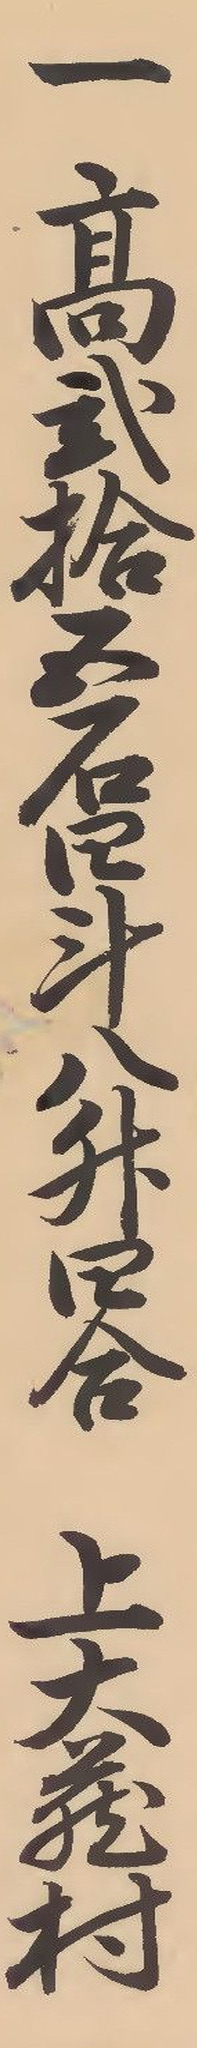一高弐拾五石四斗八升四合上大蔵村

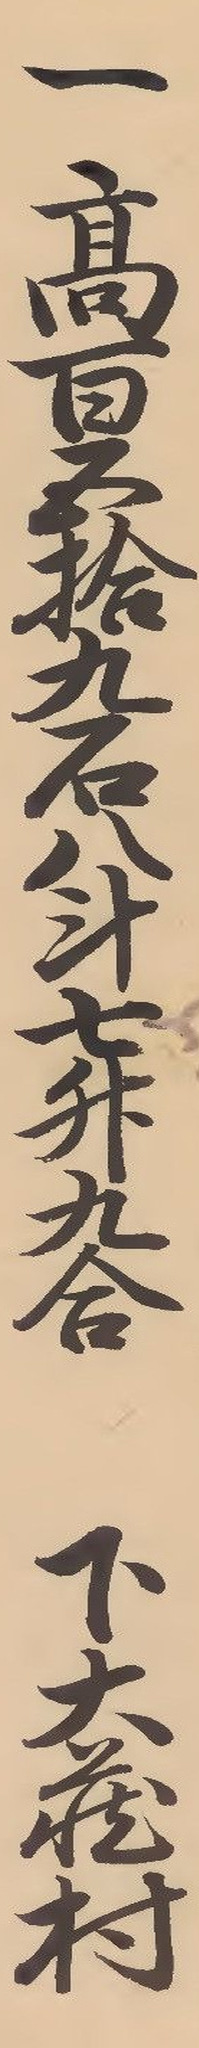一高百五拾九石八斗七升九合下大蔵村
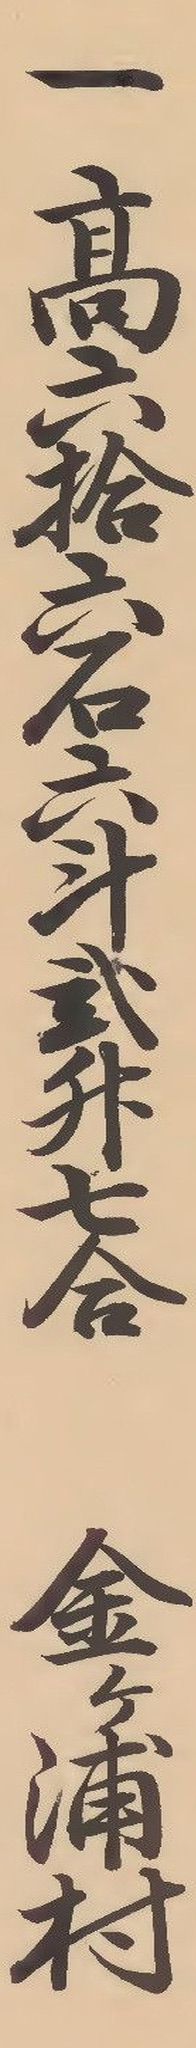一高六拾六石六斗弐升七合金ヶ浦村
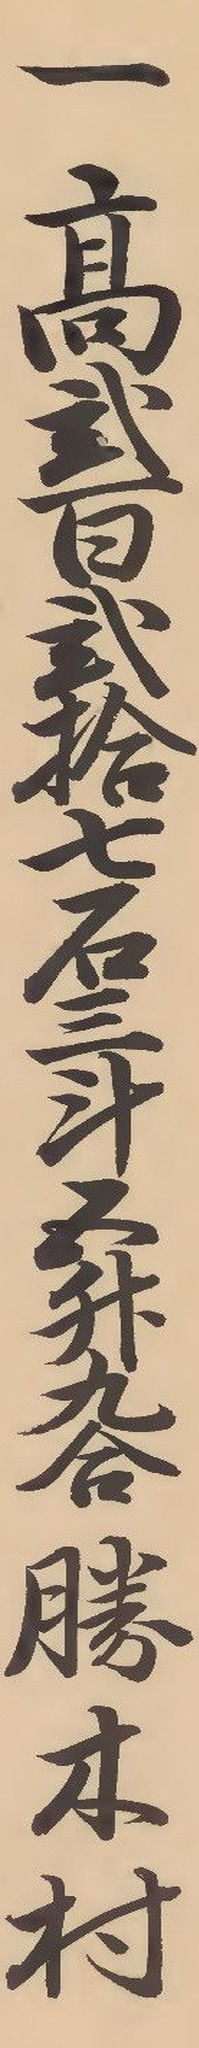一高弐百弐拾七石三斗五升九合勝木村
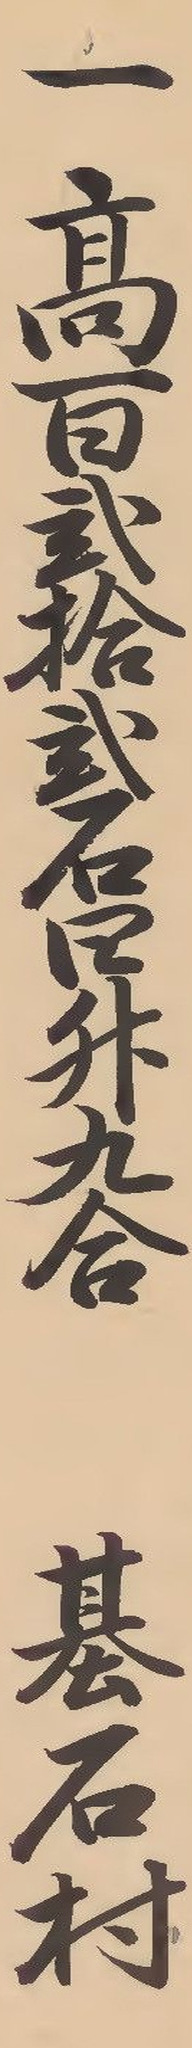一高百弐拾弐石四升九合基石村
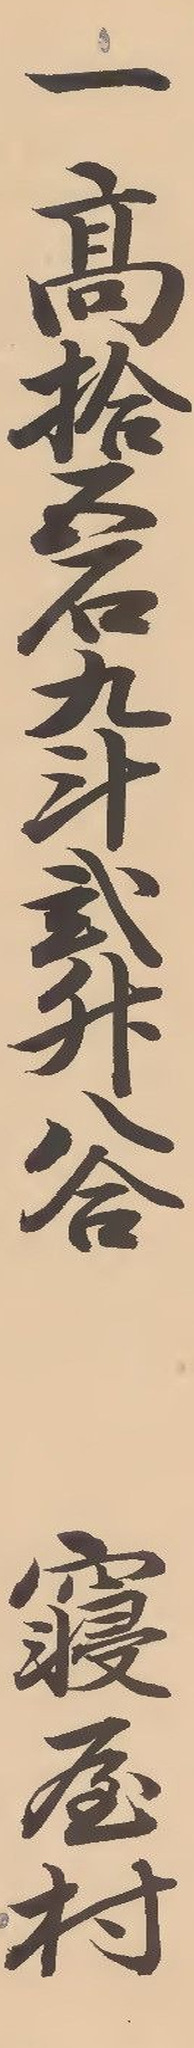一高拾五石九斗弐升八合寝屋村
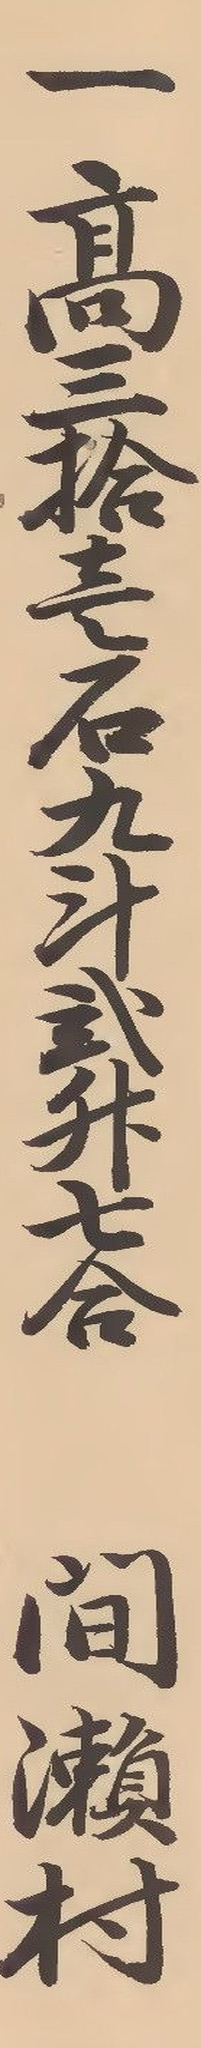一高三拾壱石九斗弐升七合間瀬村
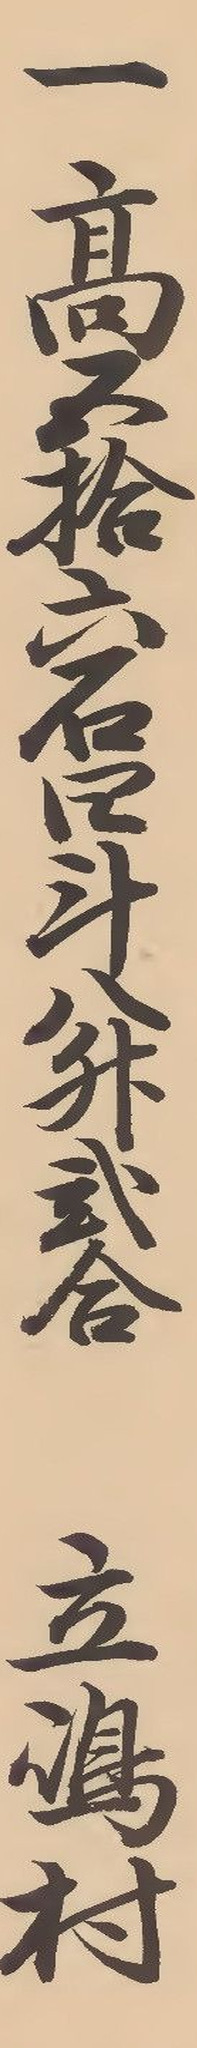一高五拾六石四斗八升弐合立島村
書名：越後国郷帳　下
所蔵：国立公文書館 National Archives of Japan
